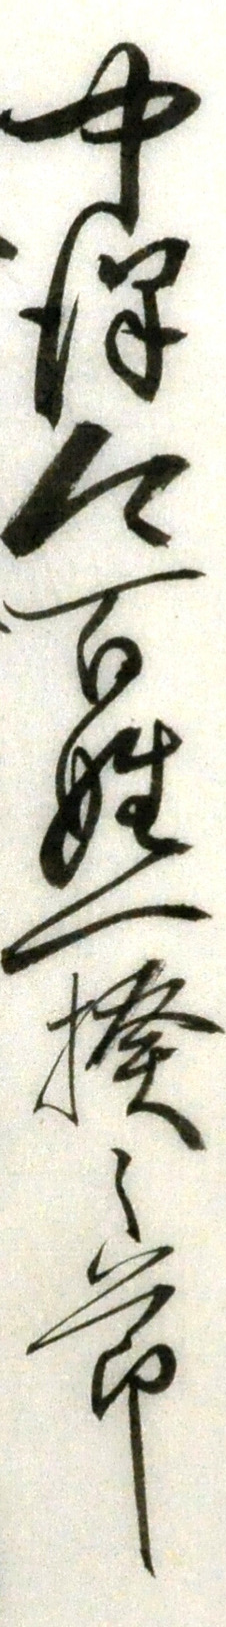中沢郷百姓一揆之節
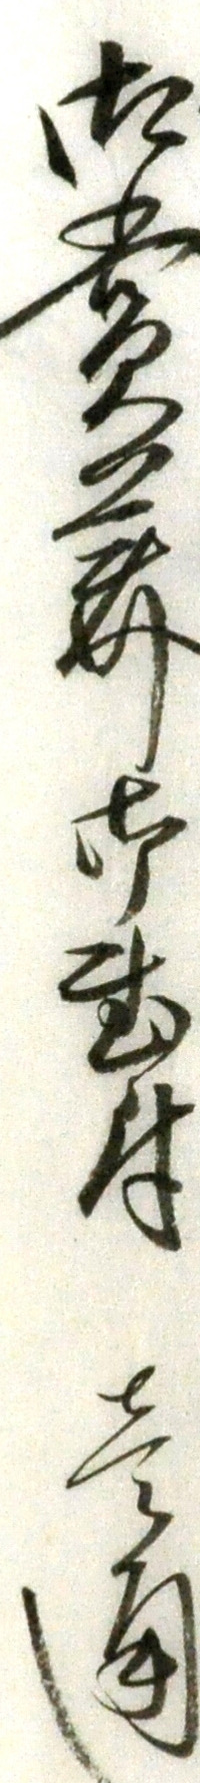御賞美御書付壱通
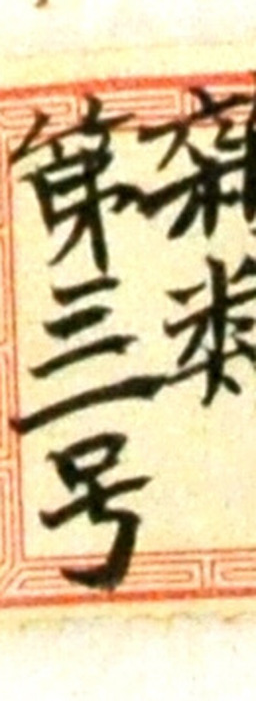第三号

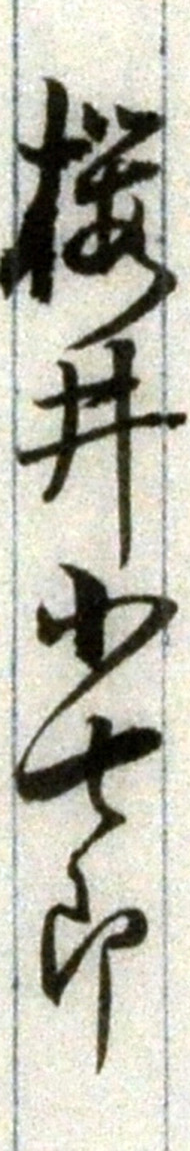櫻井小七郎
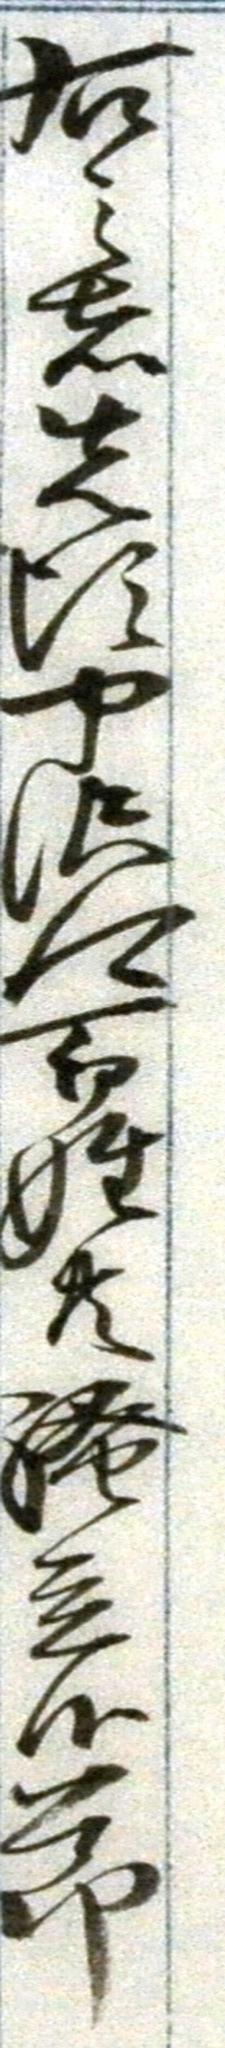右之者先頃中沢郷百姓共騒立候節
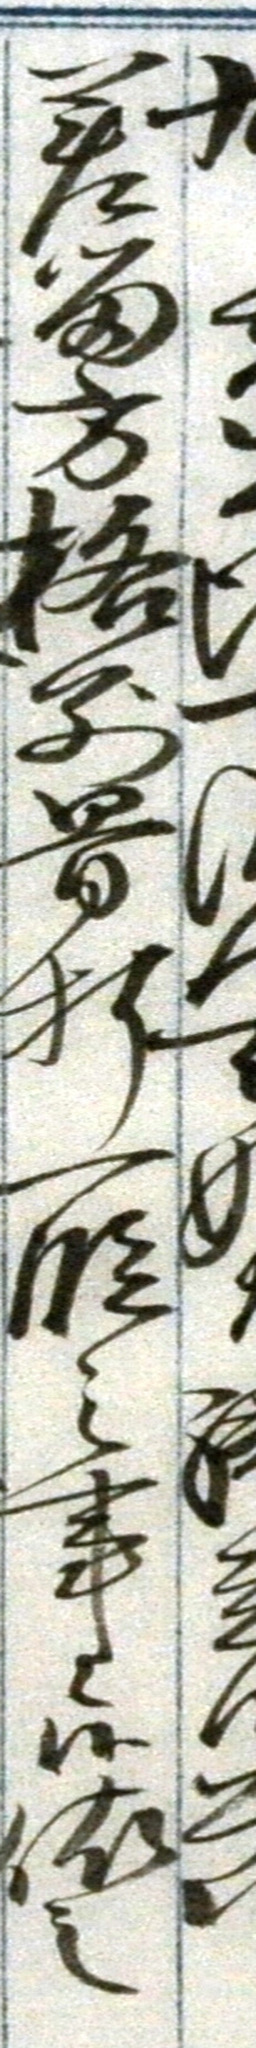差留方格別骨折一段之事ニ候依之
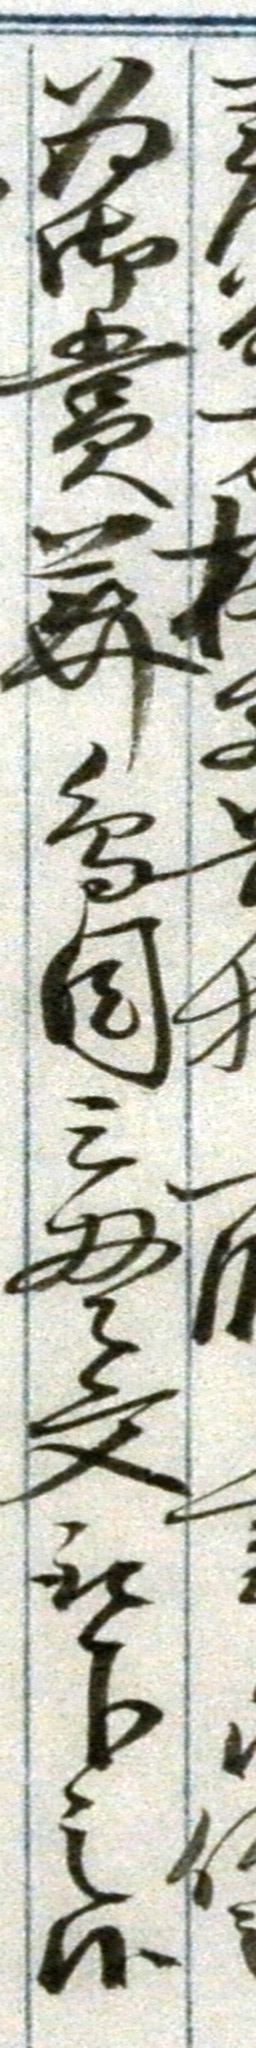為御賞美鳥目三両壱文被下之候
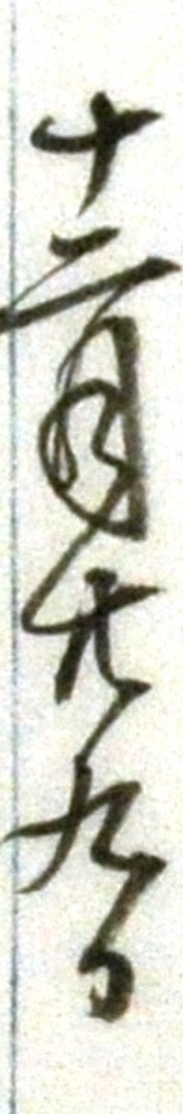十二月廿九日

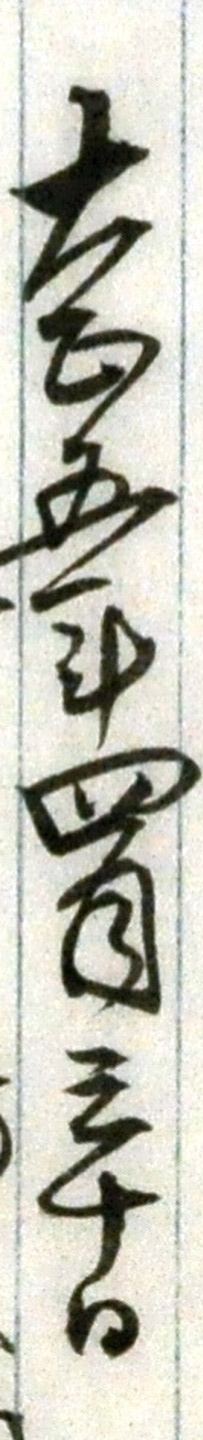大正五年四月三十日
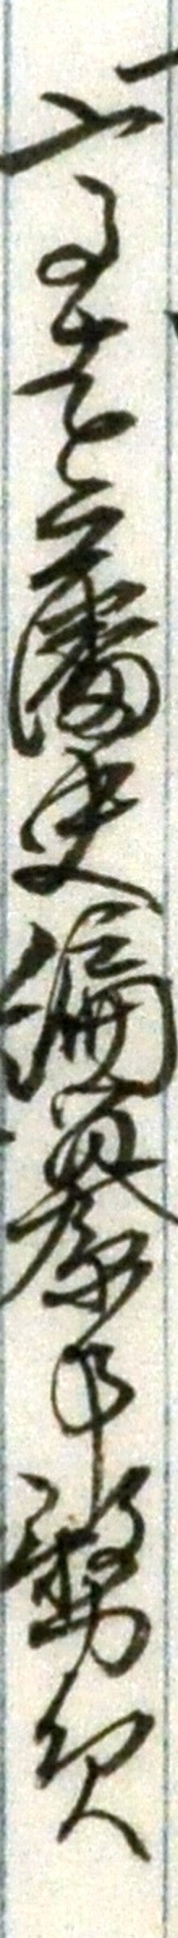高遠藩史編纂事務員
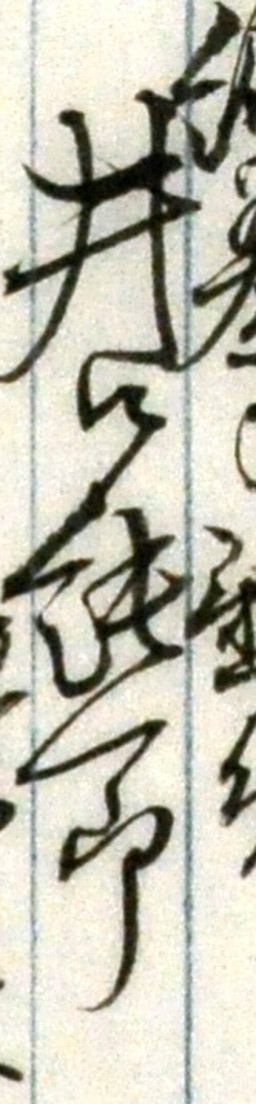井口純一郎
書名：中沢村百姓一揆之筋御賞美書付
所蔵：伊那市立高遠町図書館・合同会社AMANE
